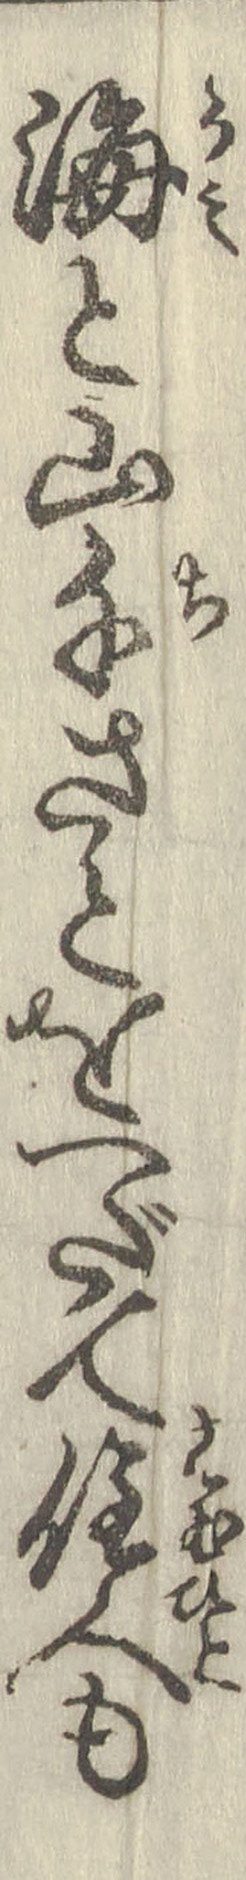海と山千さとをへだて住人も
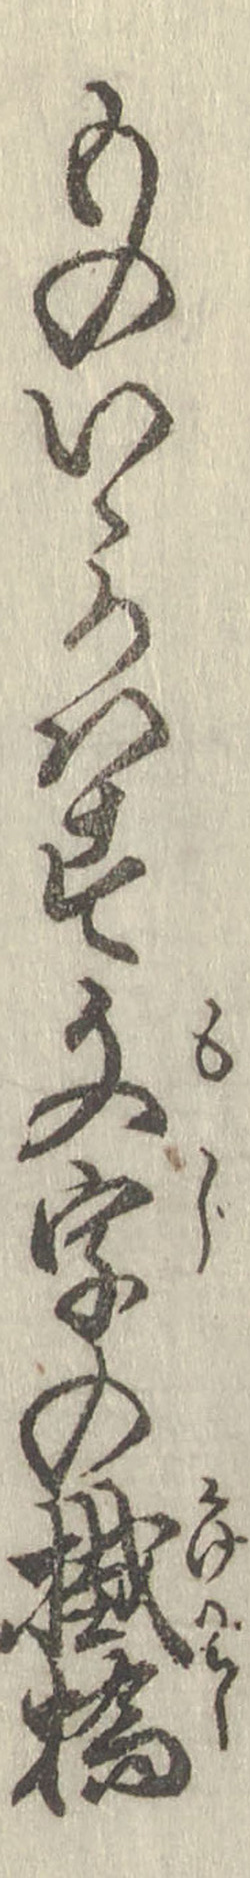ものいゝかはす文字の掛橋
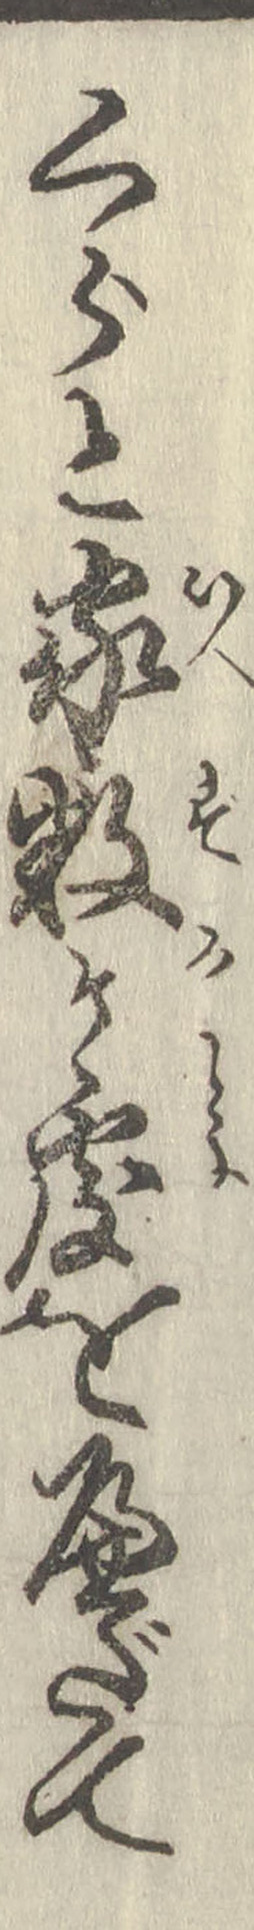くらと家数ヶ処をへだて
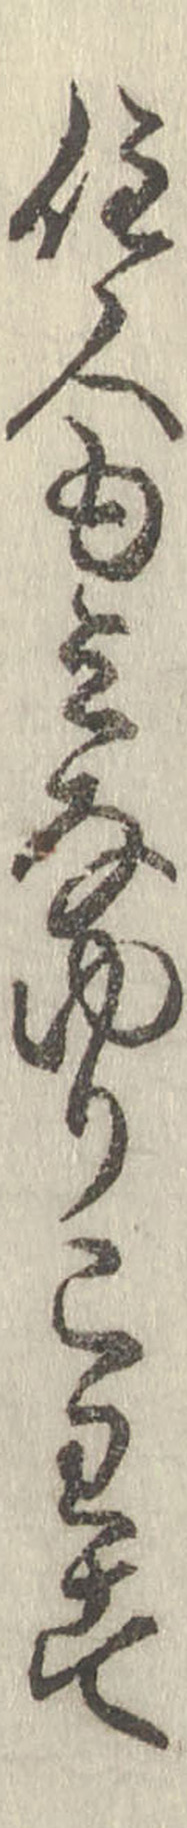住人もみなゆりこわす
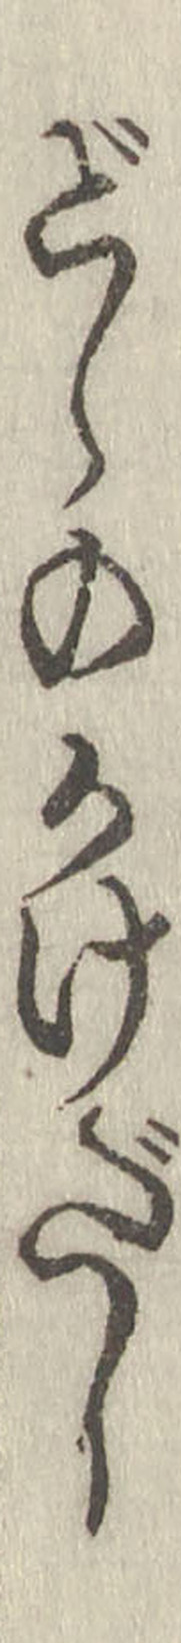どしのかけだし
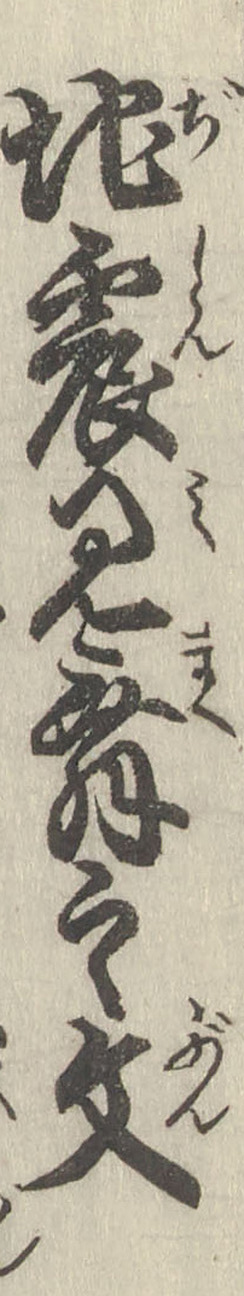地震見舞之文
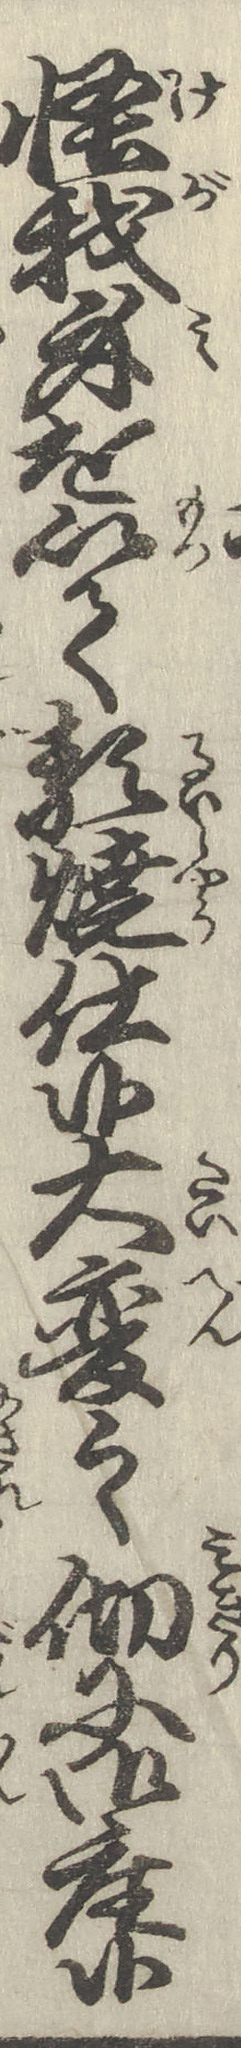怪我身を以て類焼仕候大変之砌に御座候
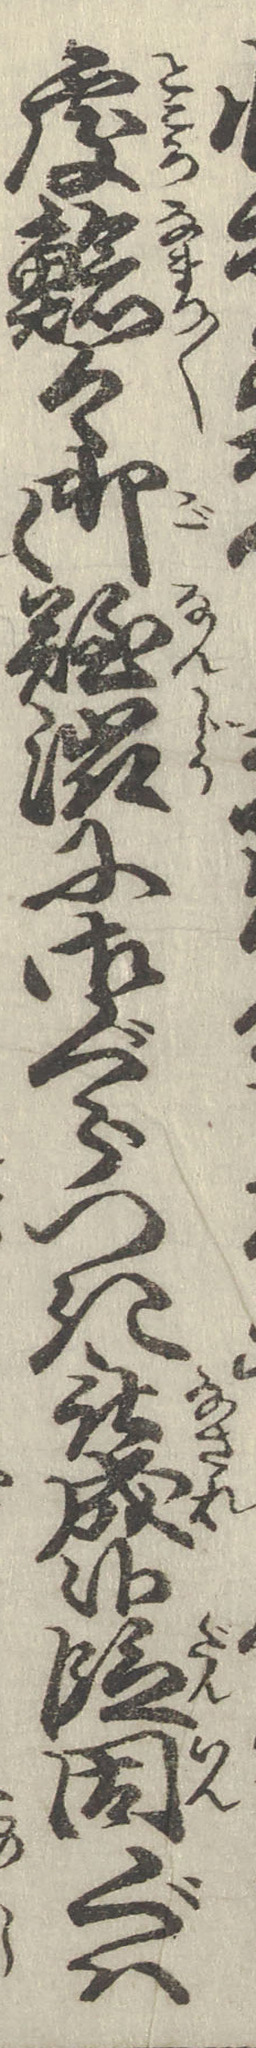処鯰々御難渋に御ぐらつき被成候段因ぐは
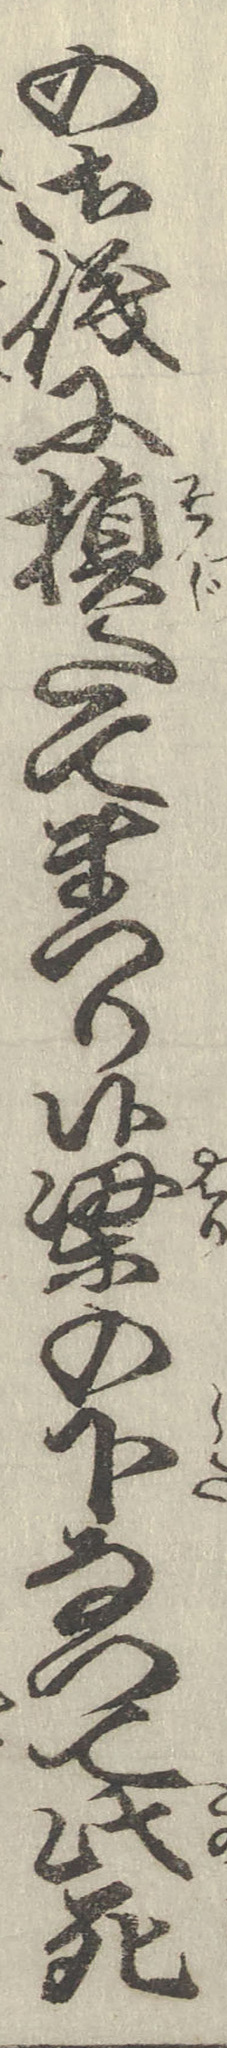の御儀に損たてまつり候梁の下なつて此死
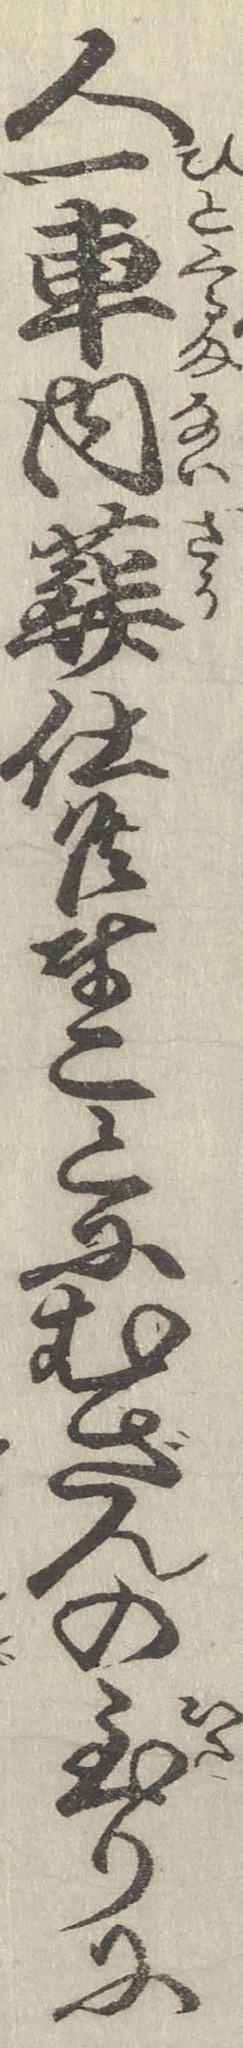人一車内葬仕候まことにむざんの至りに
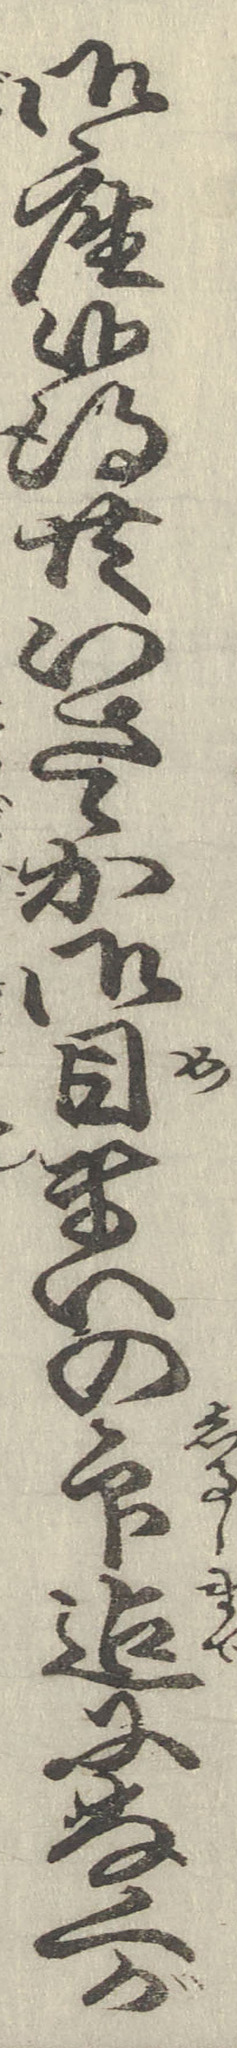御座候得共いさゝか御目まいの印迄になくが
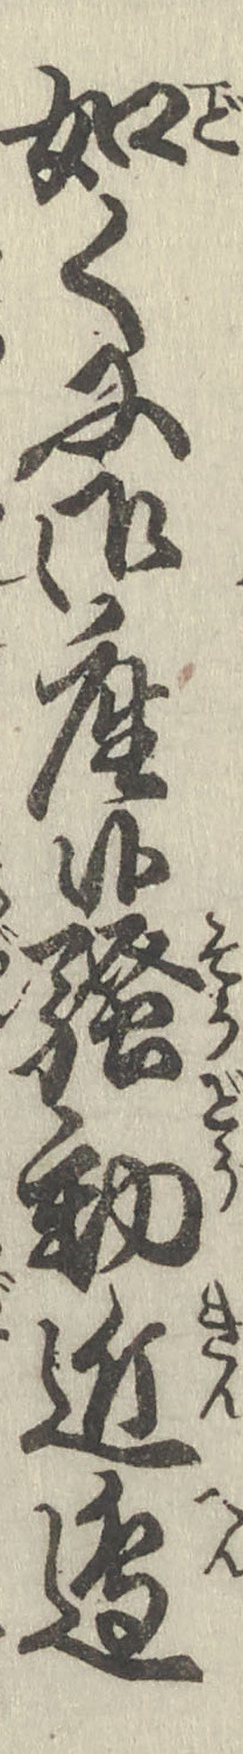如くに御座候騒動近辺
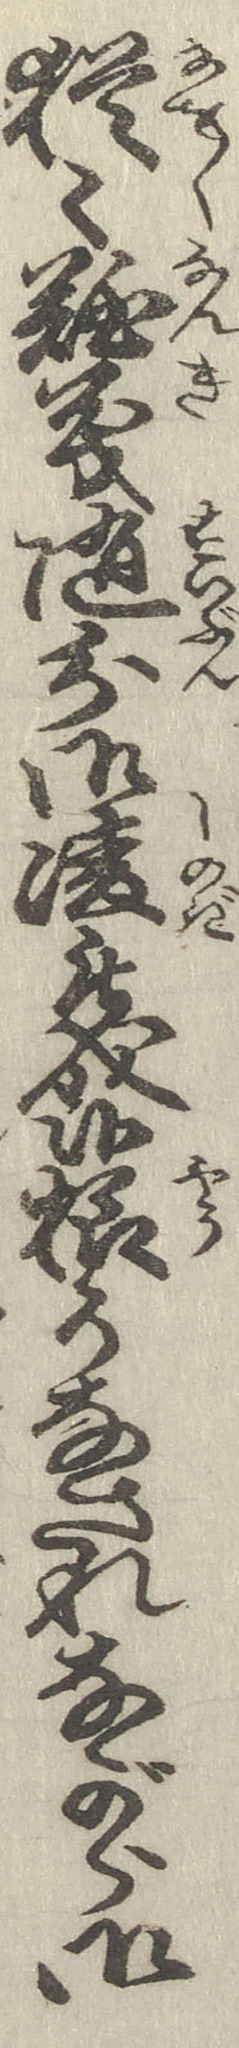猶々難義随分御凌被成候様うなされながら御
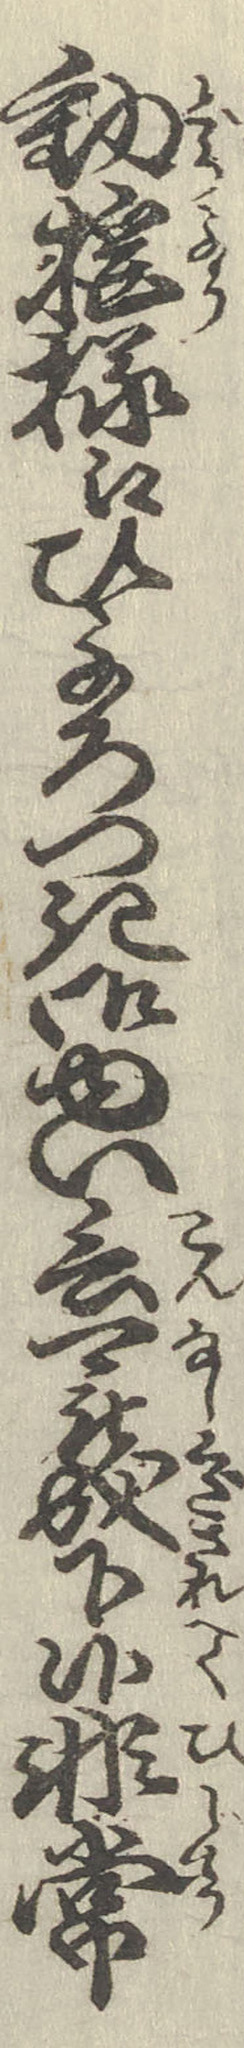動揺様江ひよろつき御ゆい言可被成下候非常
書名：不用大変勧進要文集
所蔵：東京大学総合図書館 General Library in the University of Tokyo, JAPAN
